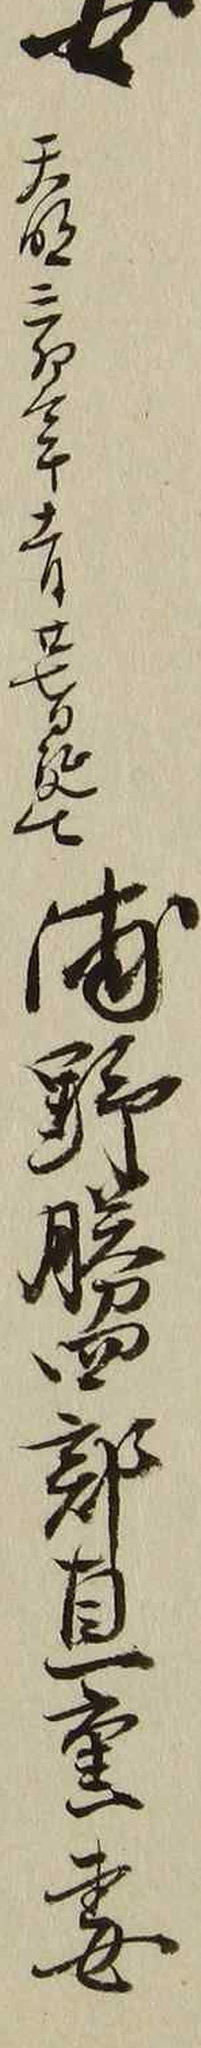女天明三卯年十一月廿七日誕生浦野勝四郎直重妻
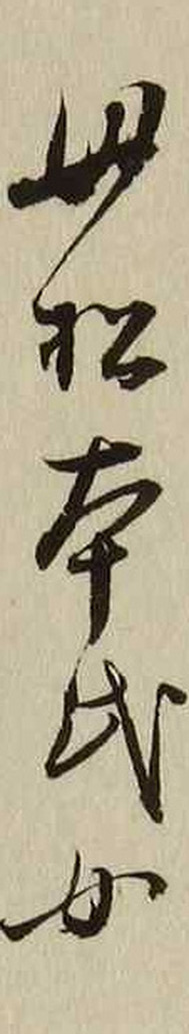母松本氏女
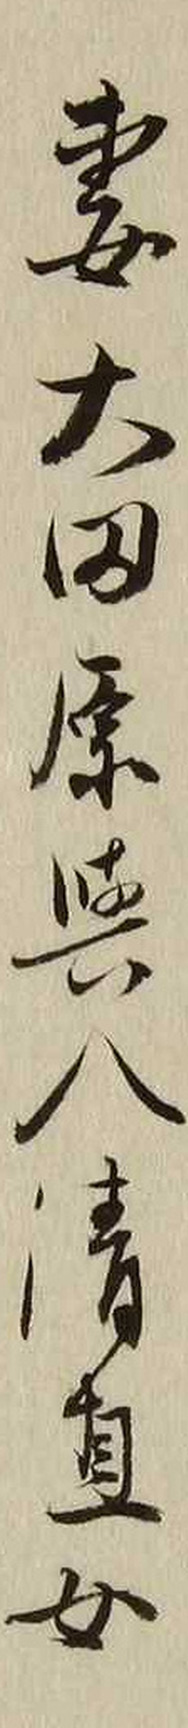妻大田原輿八清直女
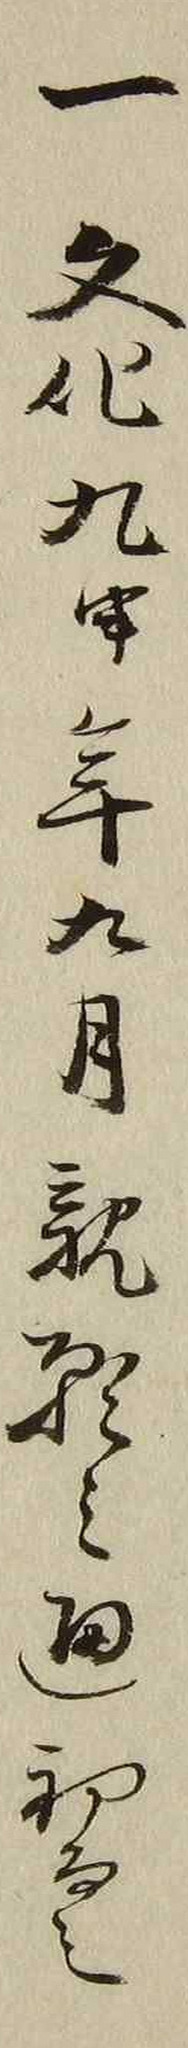一文化九申年九月親願之通初而之
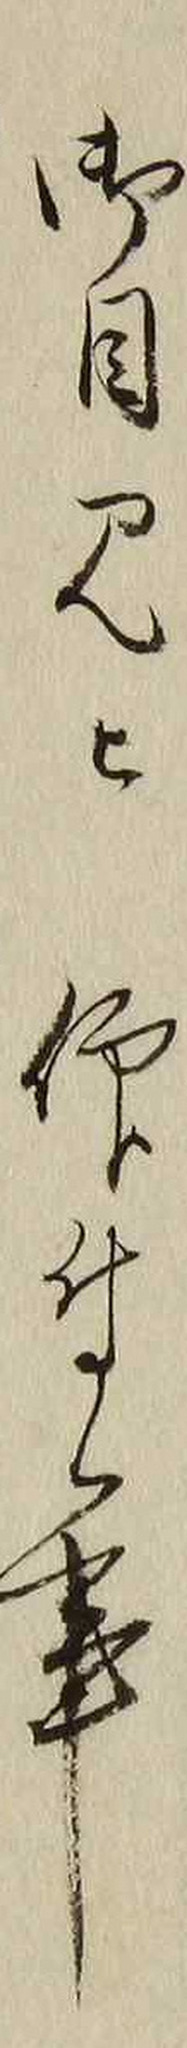御目見被仰付候事
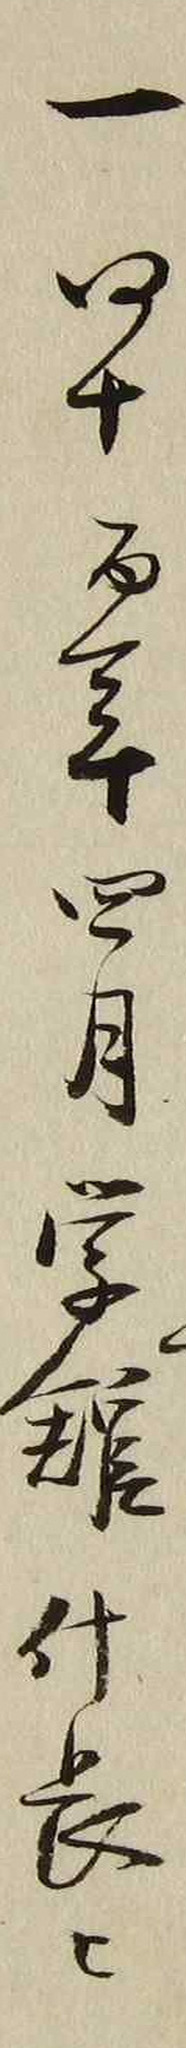一同十酉年四月学館什長被
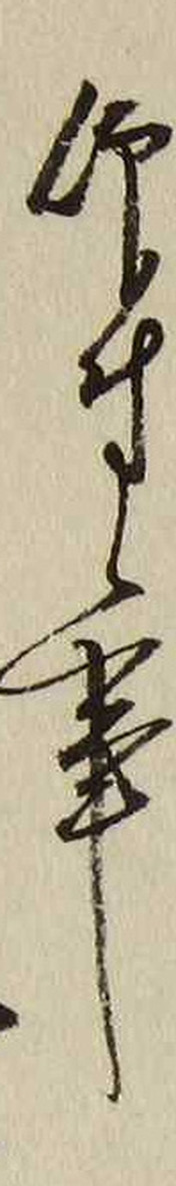仰付候事
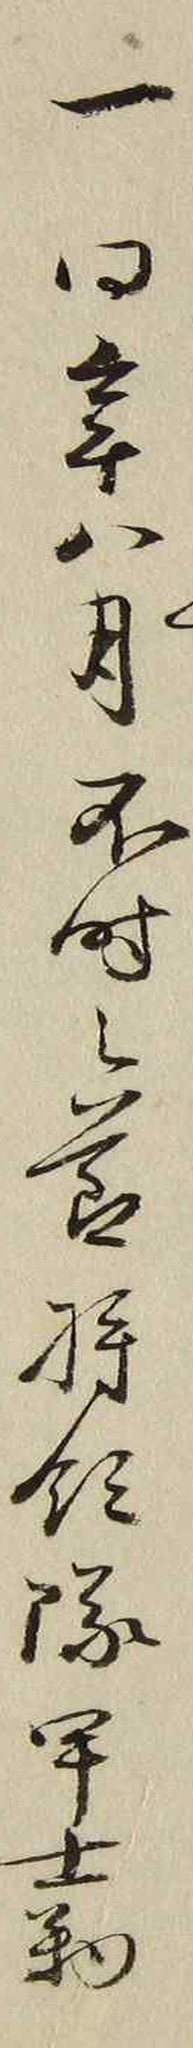一同年八月不時之節拝領隊甲士勤
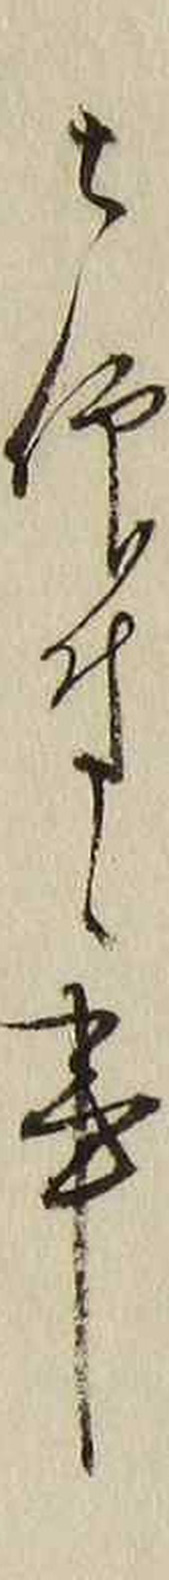被仰付候事
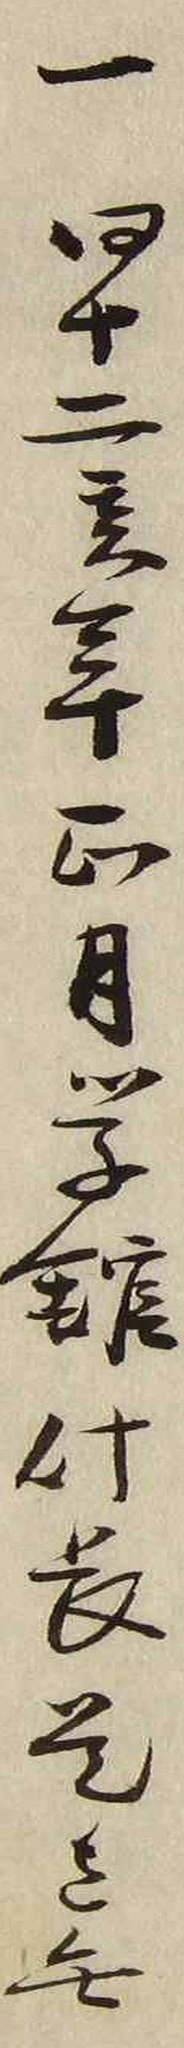一同十二亥年正月学館什長是迄無
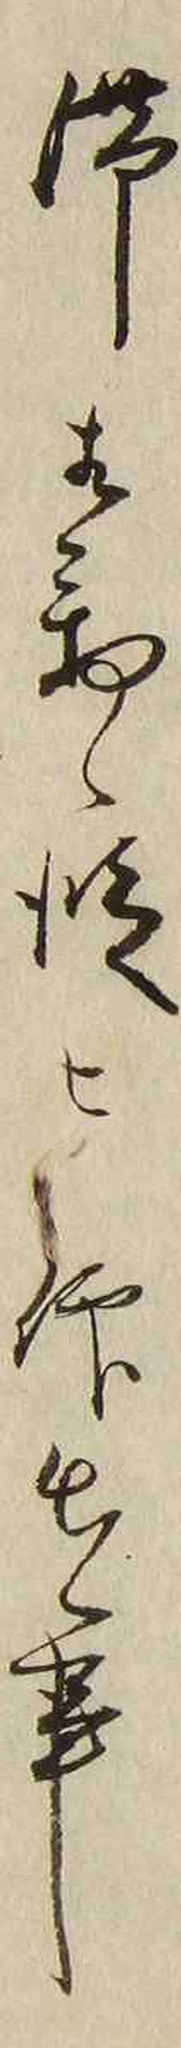滞相勤候段被仰出候事

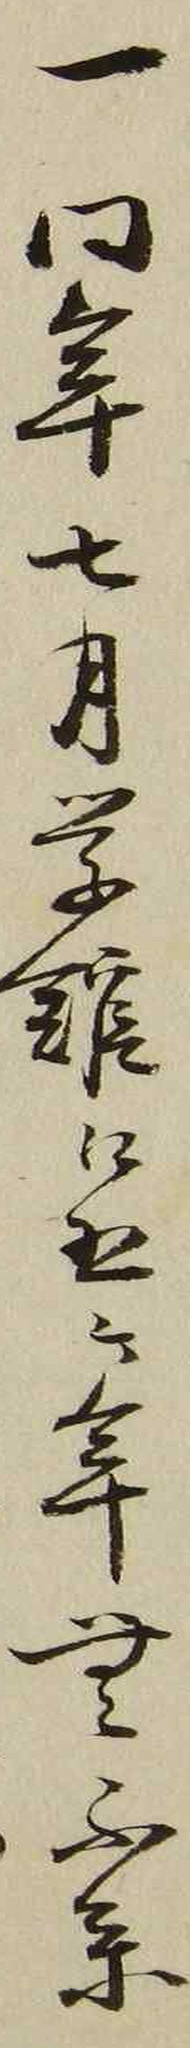一同年七月学館江五ヶ年無不参
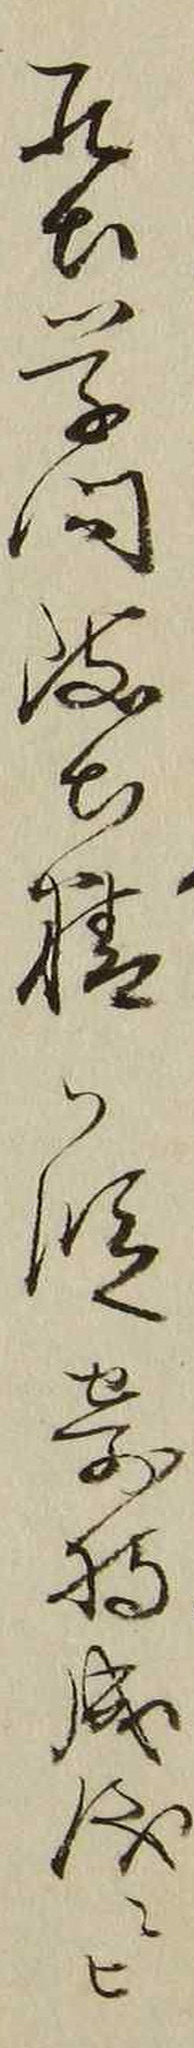罷出学問致出精候段奇特成儀に被
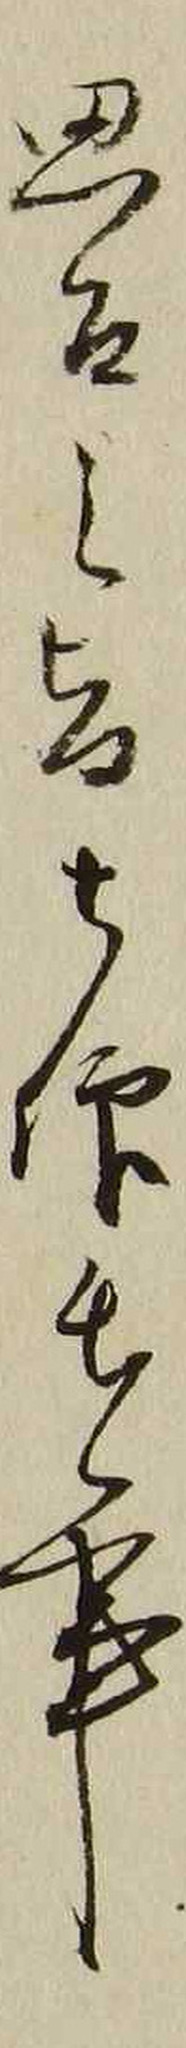思召之旨被仰出候事
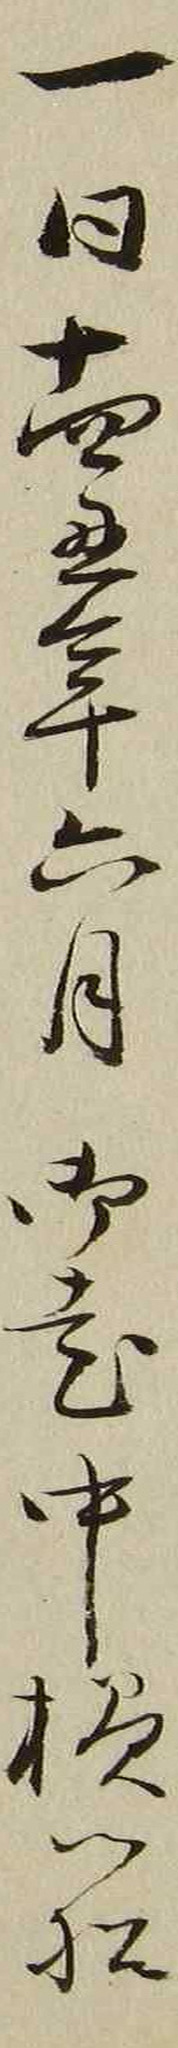一同十四丑年六月御家老中様御招
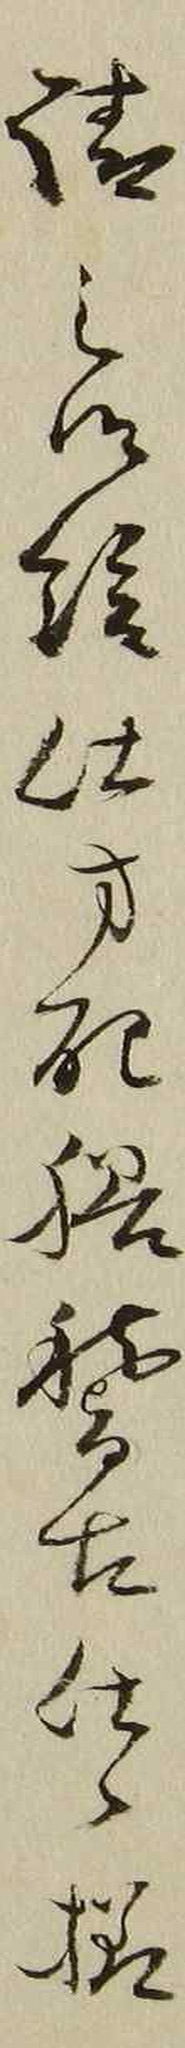請之御給仕方配膳稽古仕候様
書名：諸士系譜　巻之292　き之部1
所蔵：会津若松市立会津図書館
